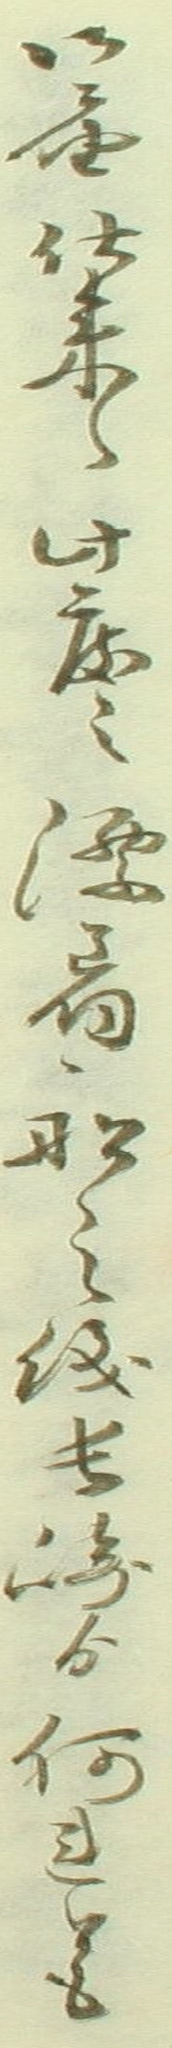御届仕来候此度之漂着船之儀長崎ゟ何れにも
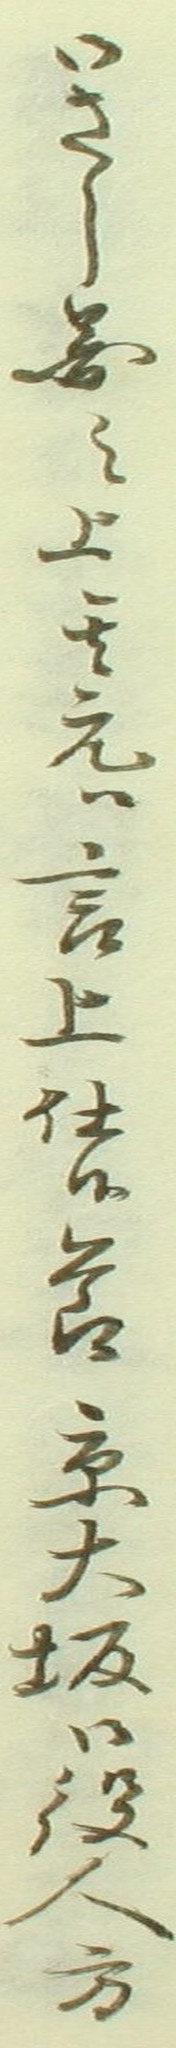御さし図之上其元は言上仕候節京大坂御役人方
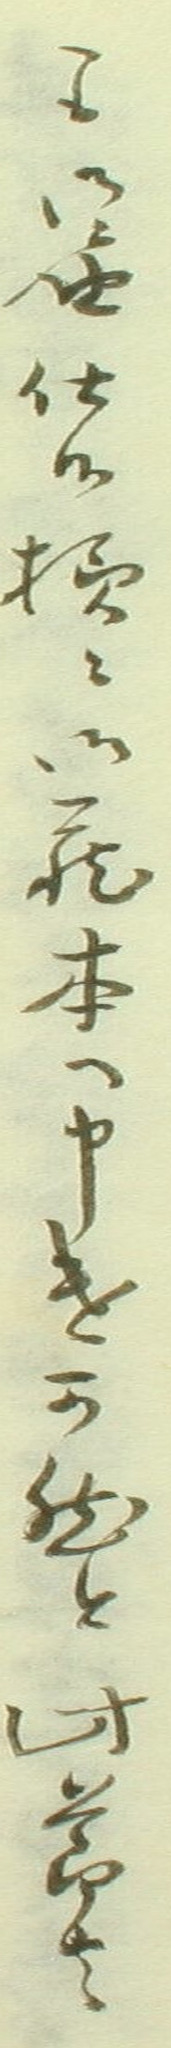へも御届仕候様に御蔵本へ申遣可然と此節は
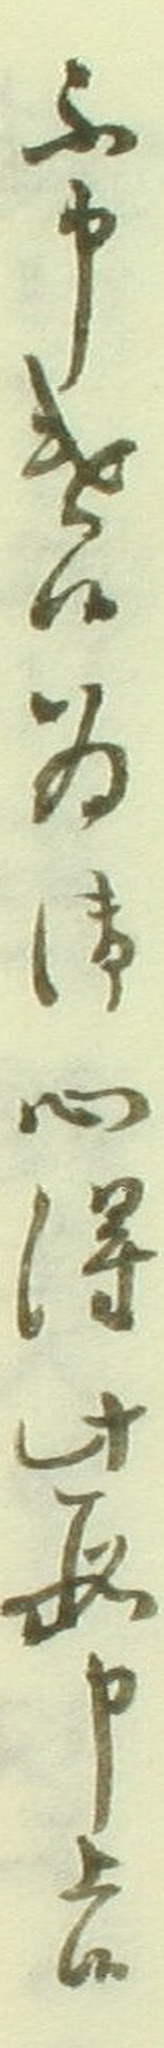不申遣候為御心得此段申上候
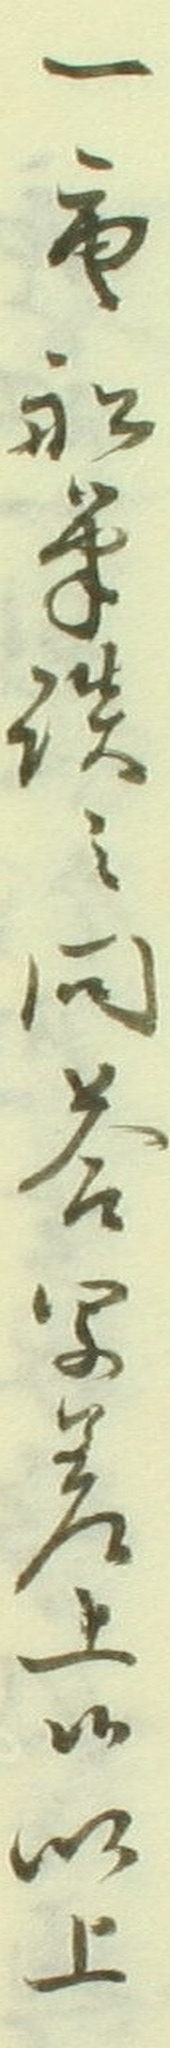一唐船筆談之問答写差上候以上
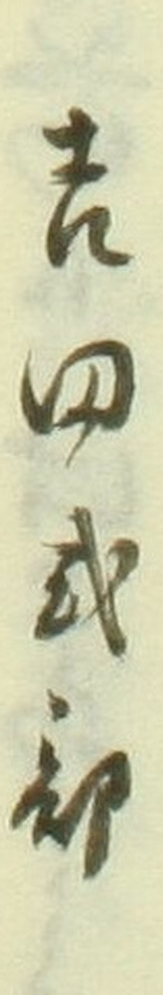吉田式部
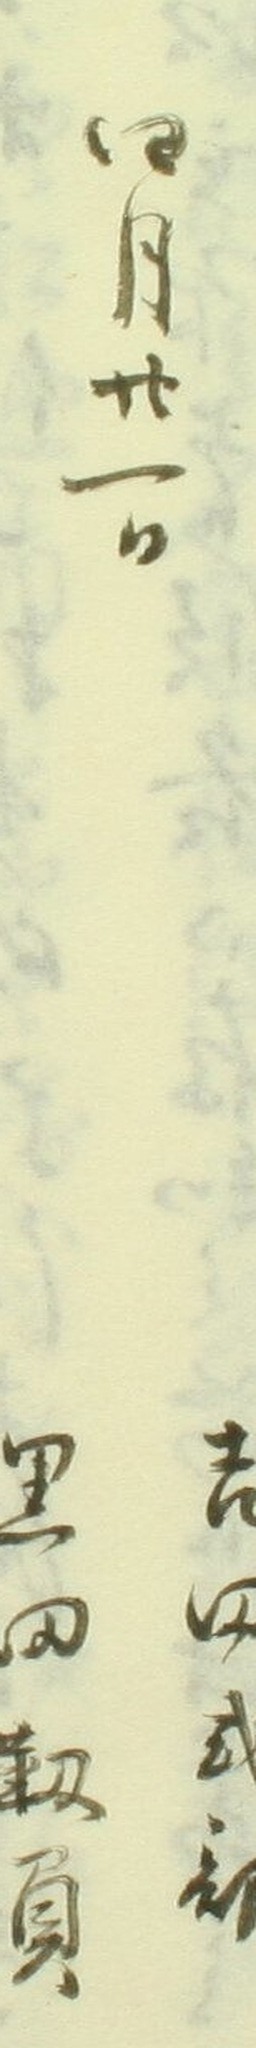四月廿一日黒田靭負
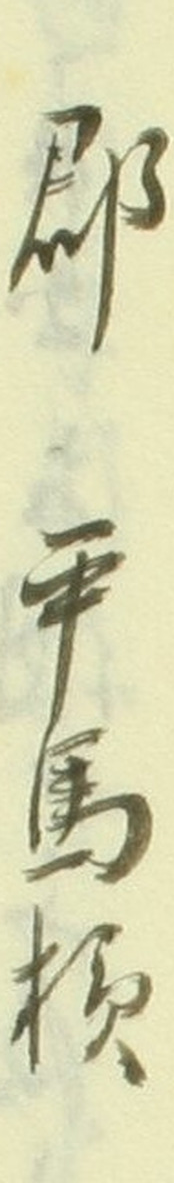郡平馬様
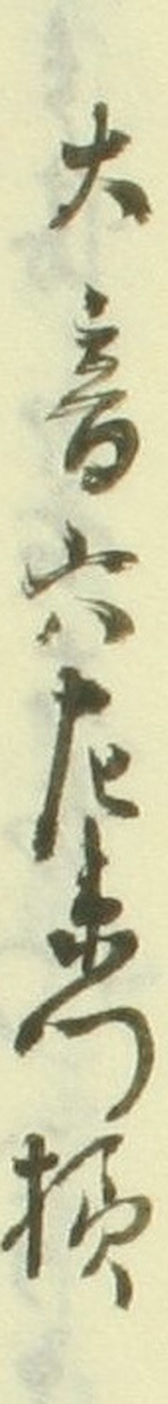大音六左衛門様
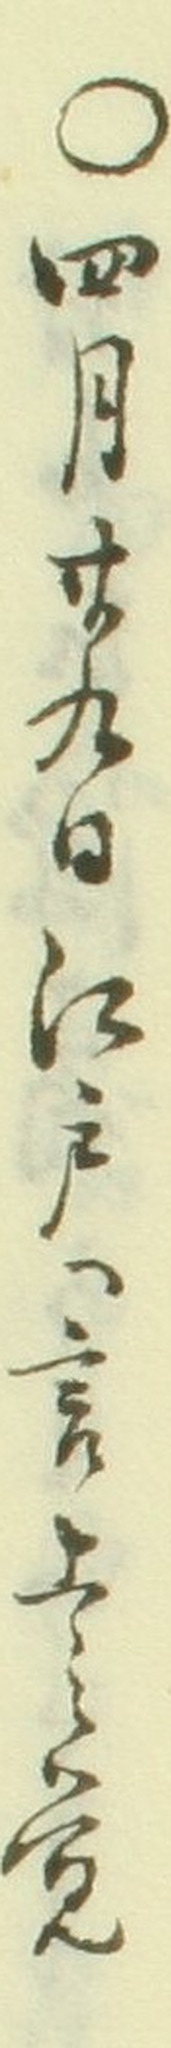〇四月廿九日江戸へ言上之覚
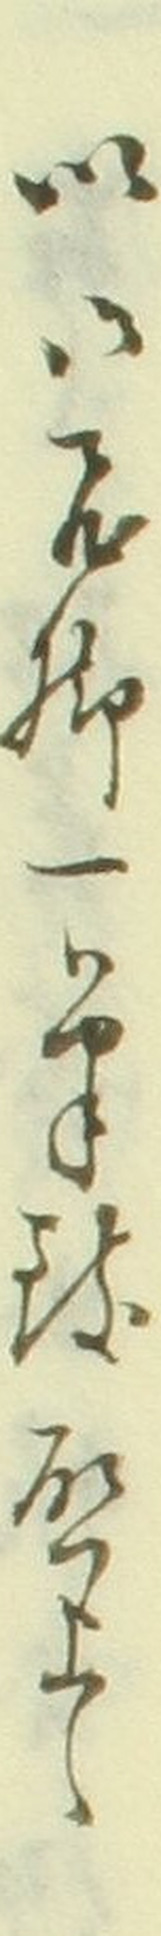以御飛脚一筆致啓上候
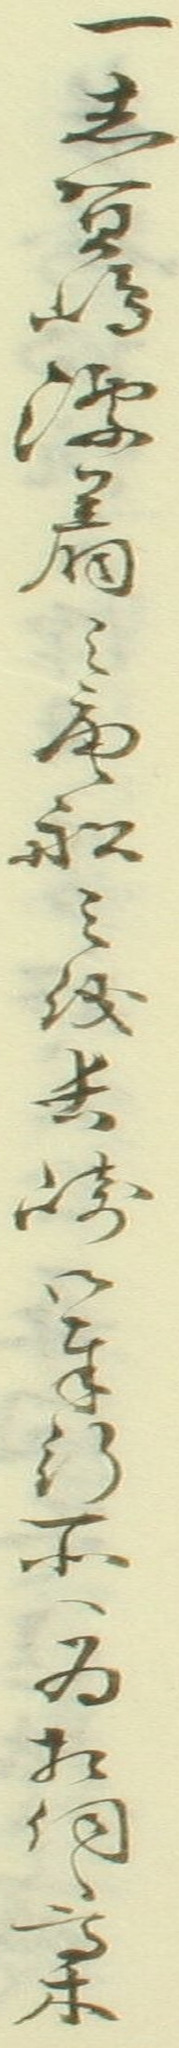一志賀島漂着之唐船之儀長崎御奉行所へ為相伺高木
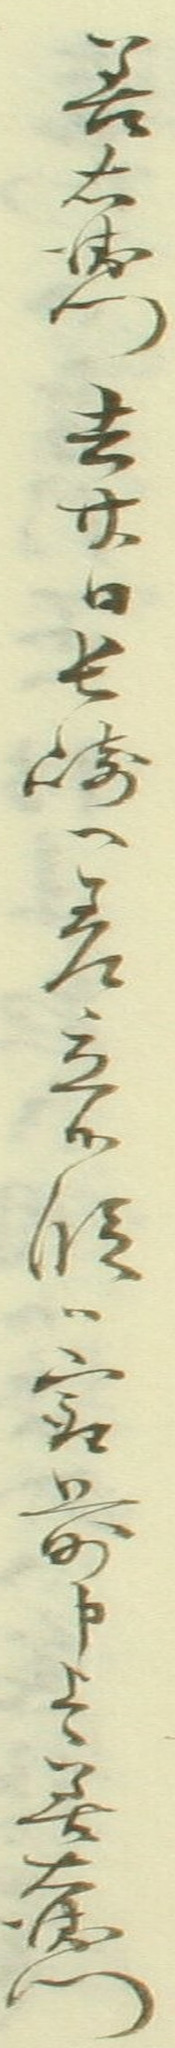善右衛門去廿日長崎へ差立候段は最前申上候善右衛門
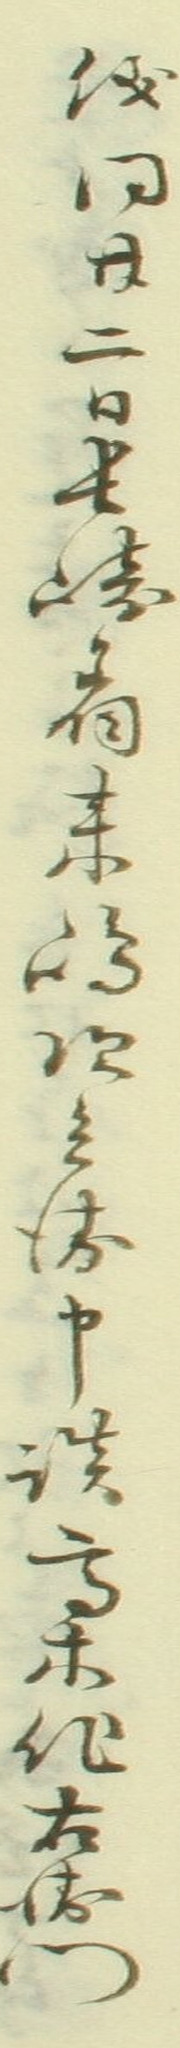儀同廿二日長崎着来嶋次兵衛申談高木作右衛門
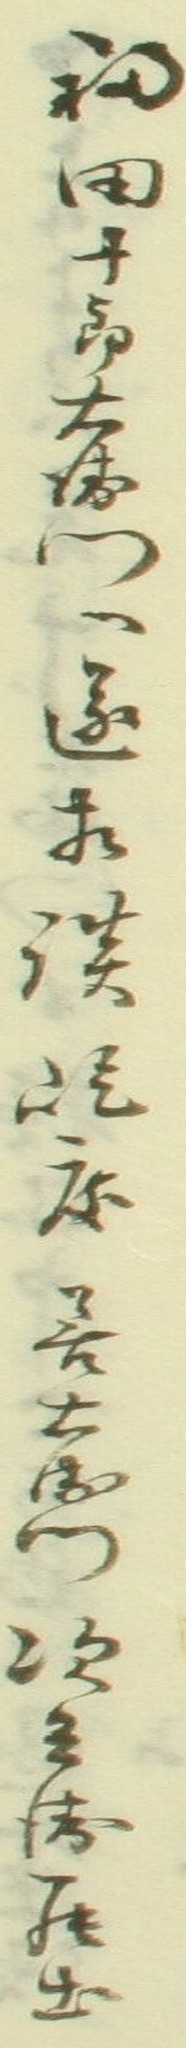福田十郎左衛門へ遂相談屹度善右衛門次兵衛罷出

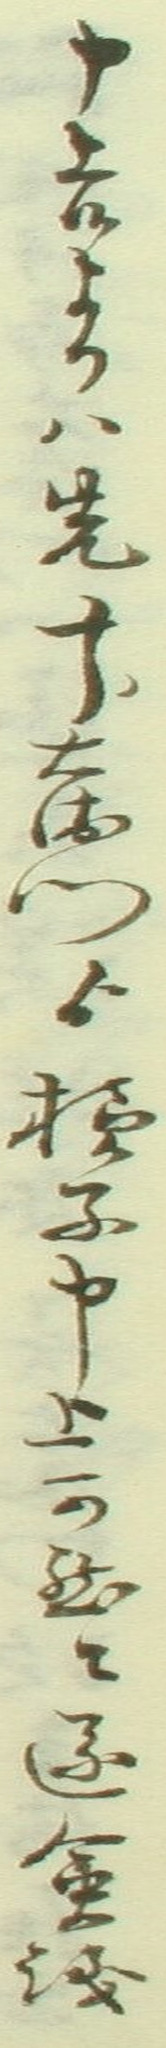申上候よりは先十郎右衛門ゟ様子申上可然と遂僉儀
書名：異国船漂着記
